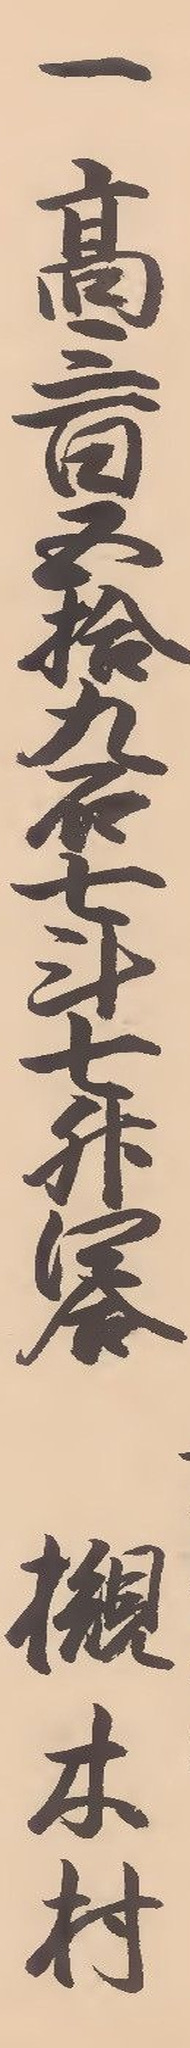一高三百五拾九石七斗七升四合槻木村
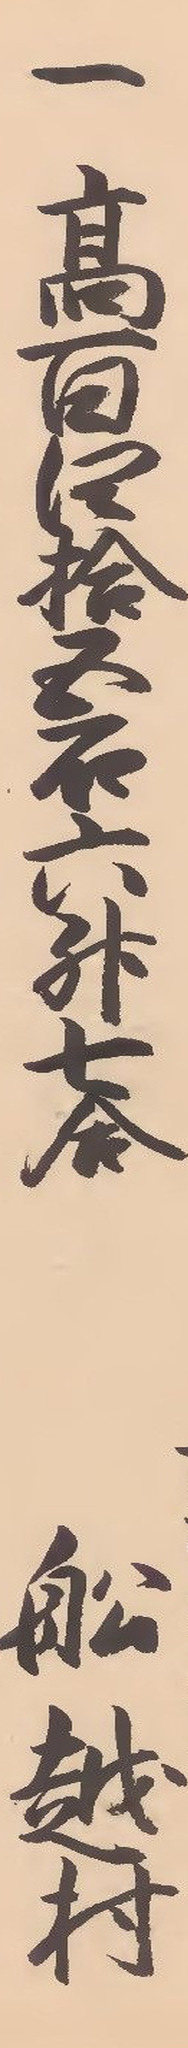一高百四拾五石六升七合船越村
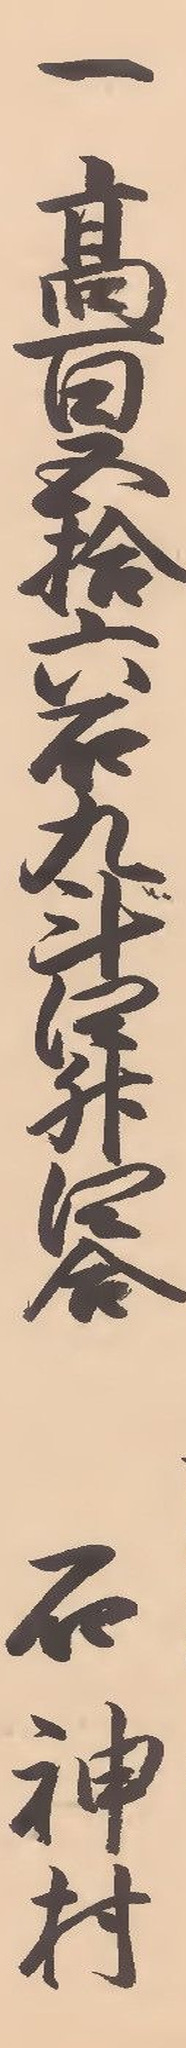一高百五拾六石九斗四升四合石神村
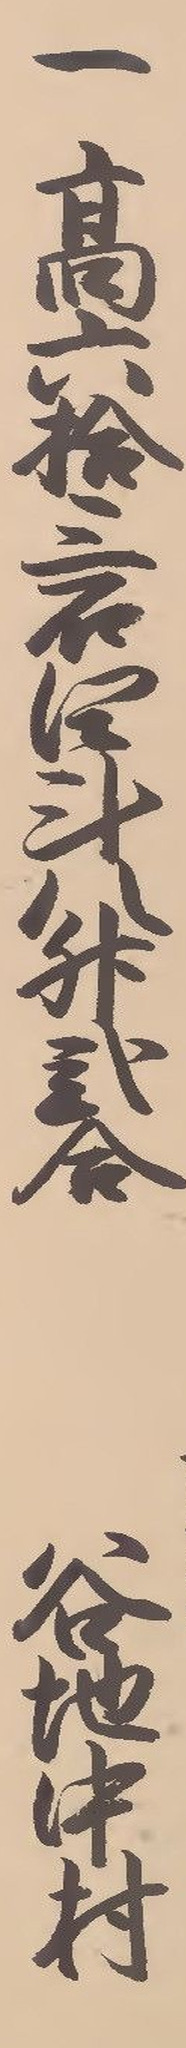一高六拾三石四斗八升弐合谷地中村
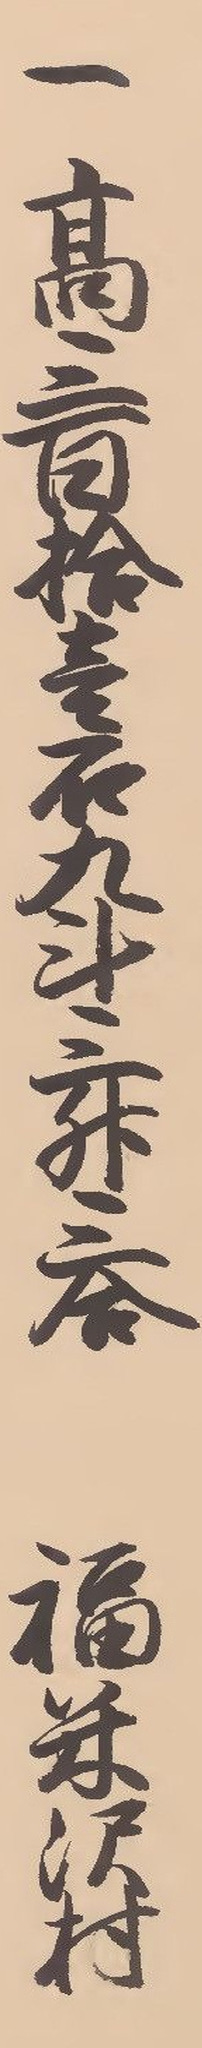一高三百拾壱石九斗三升三合福米沢村
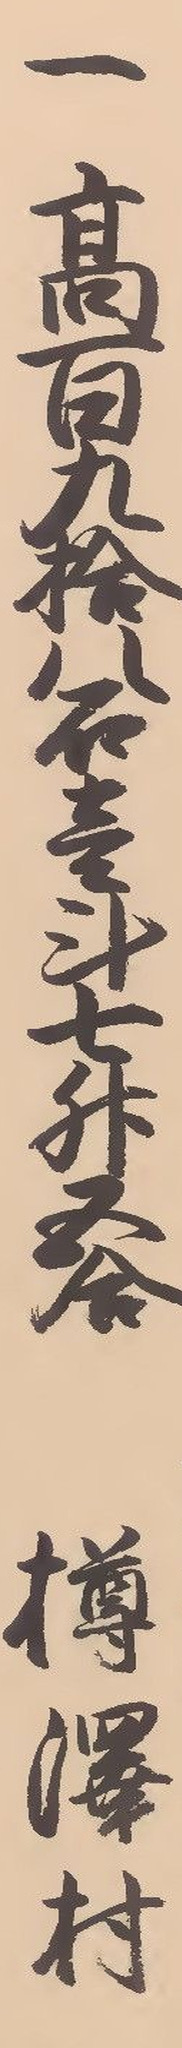一高百九拾八石壱斗七升五合樽沢村
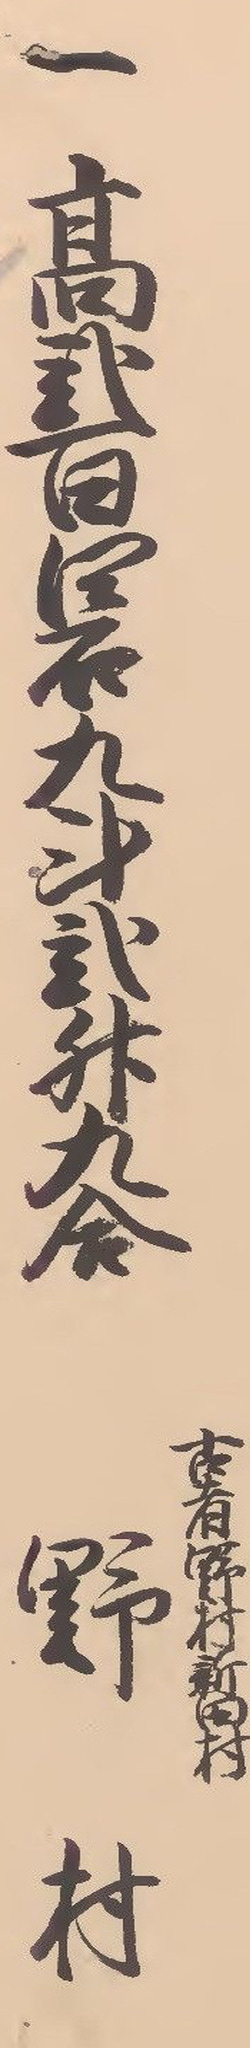一高弐百四石九斗弐升九合野村

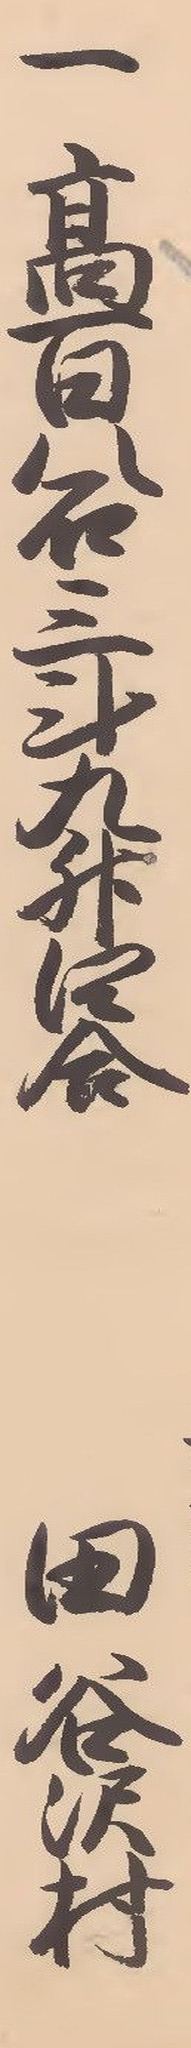一高百八石三斗九升四合田谷沢村
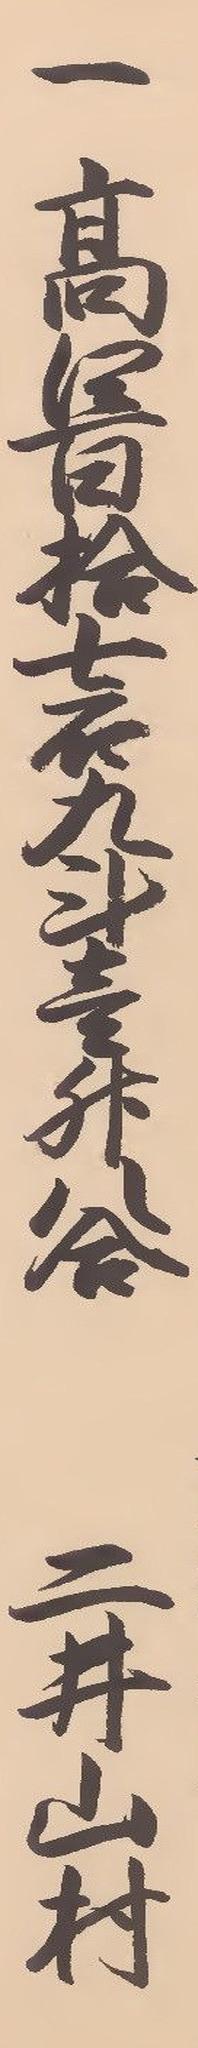一高四百拾七石九斗壱升八合二井山村
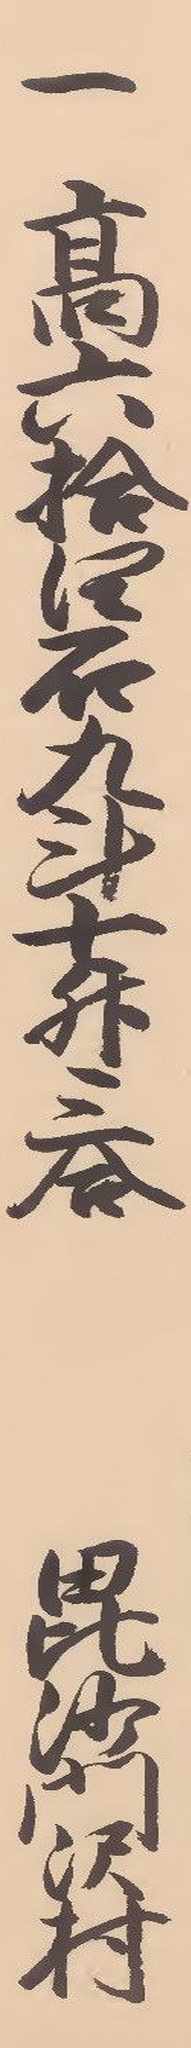一高六拾四石九斗七升三合昆沙門沢村
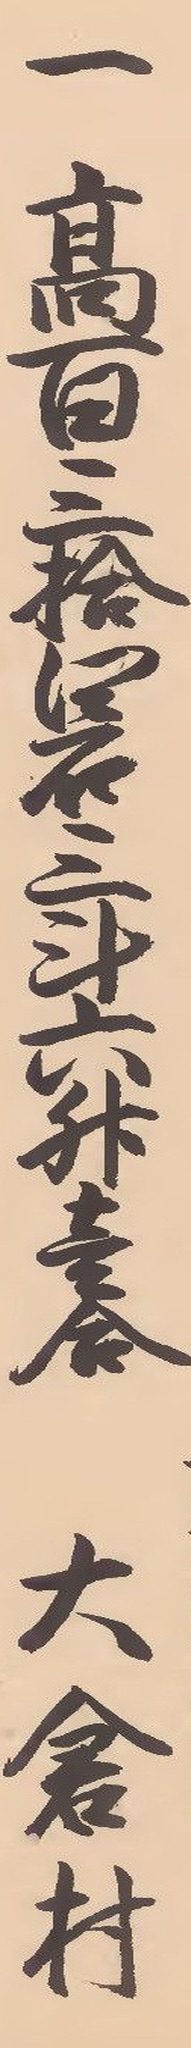一高百三拾四石三斗六升壱合大倉村
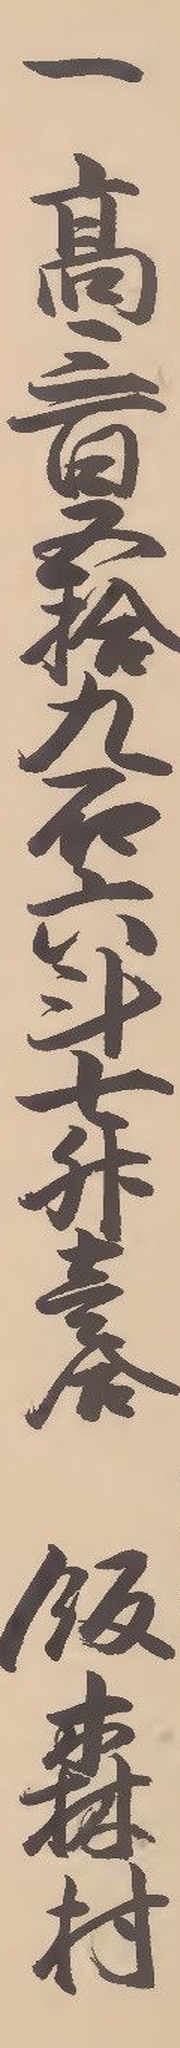一高三百五拾九石六斗七升壱合飯森村
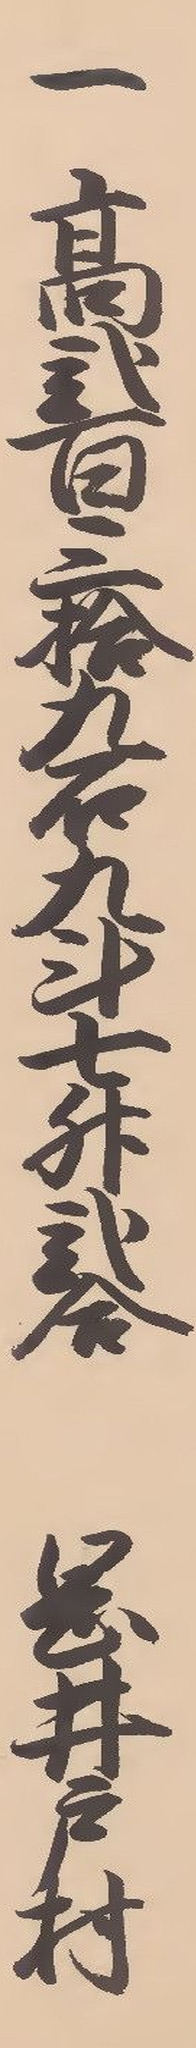一高弐百三拾九石九斗七升弐合岡井戸村
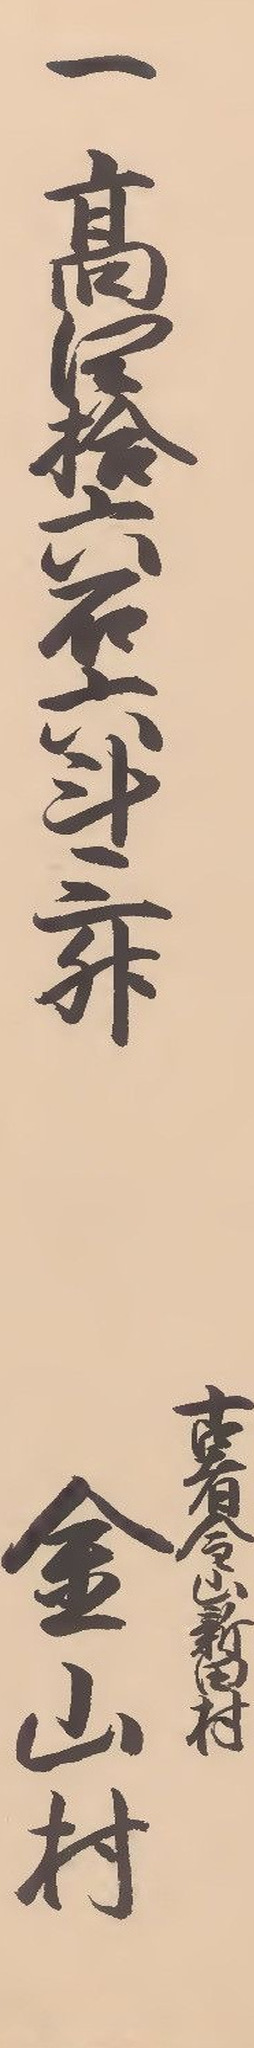一高四拾六石六斗三升金山村
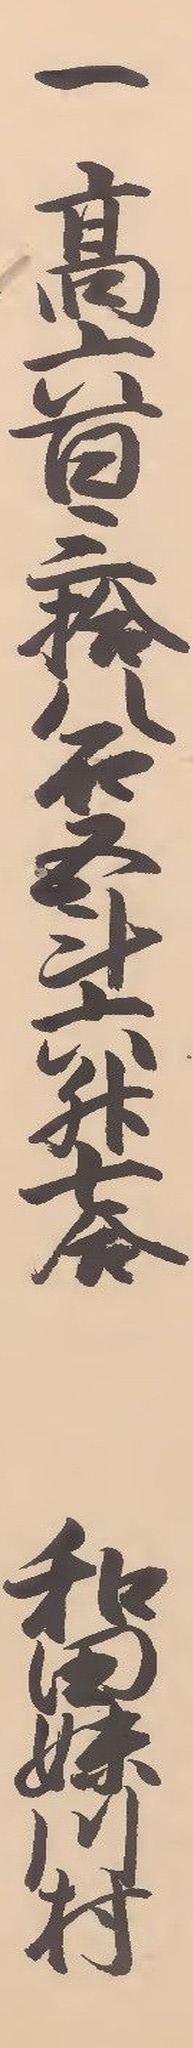一高六百三拾八石五斗六升七合和田妹川村

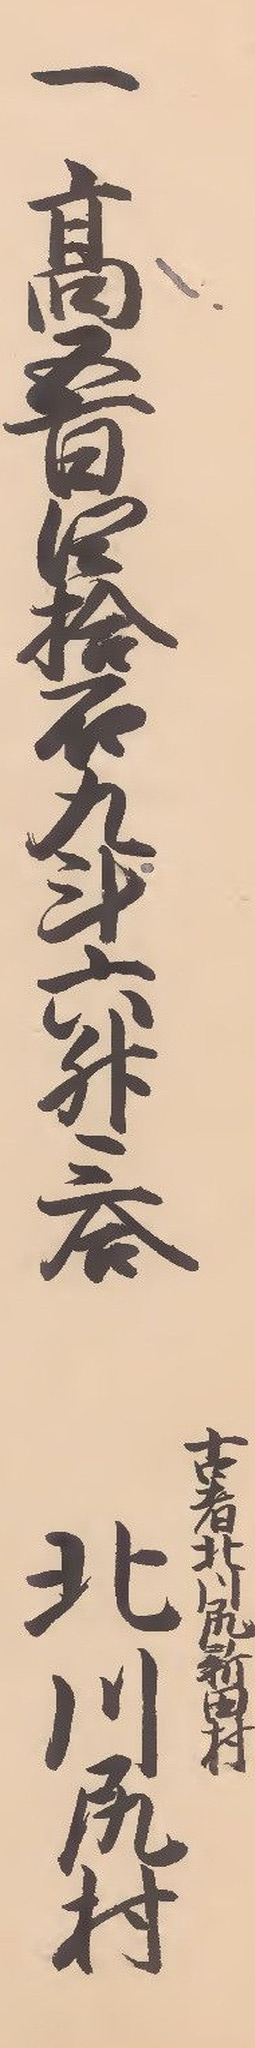一高五百四拾石九斗六升三合北川尻村
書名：出羽国郷帳　５
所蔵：国立公文書館 National Archives of Japan
